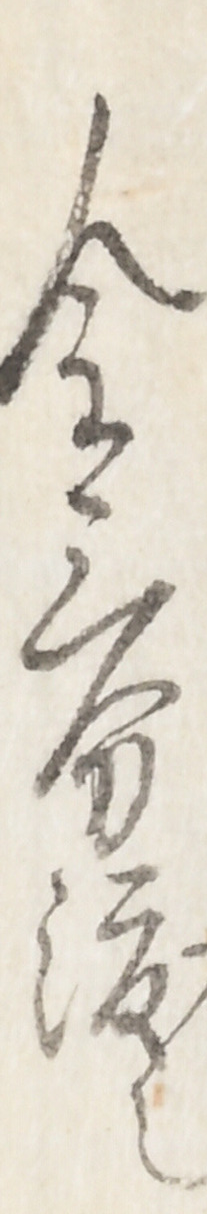金三分渡し
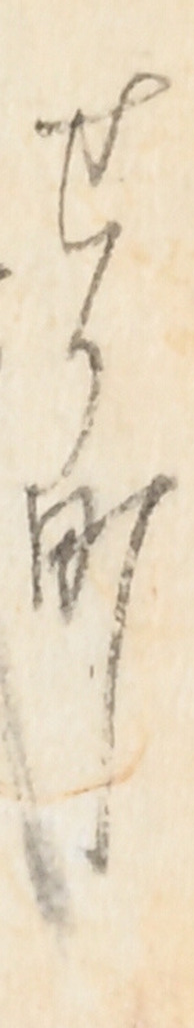せり町
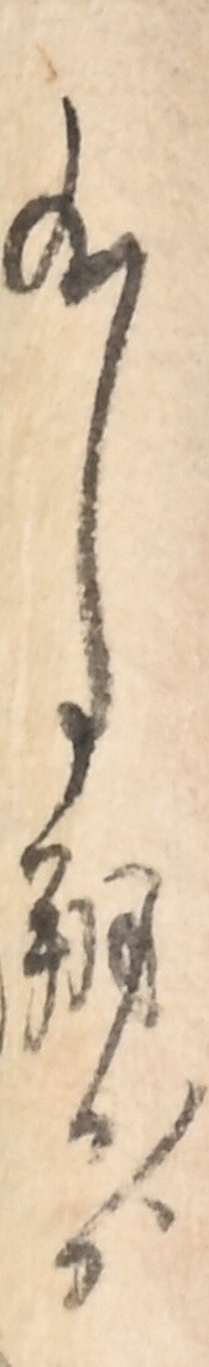九月五日ゟ
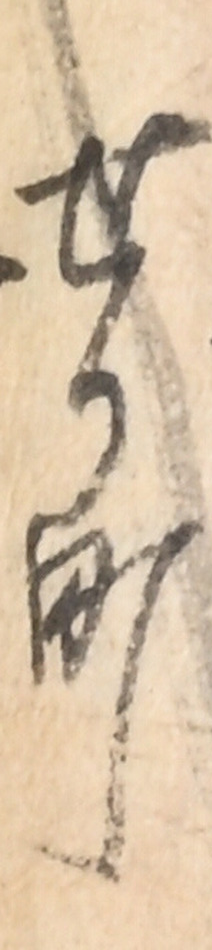せり町
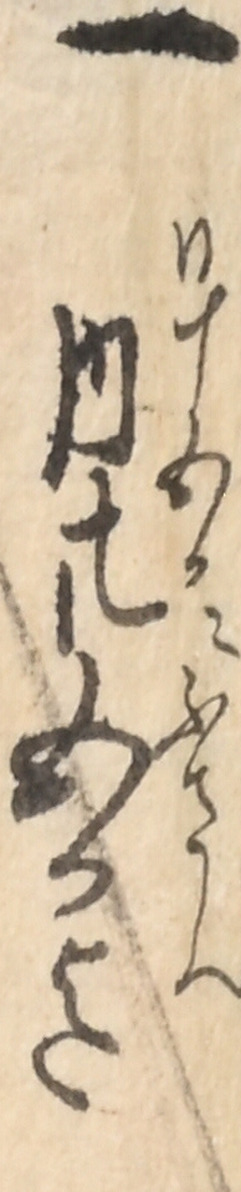同廿九日迄
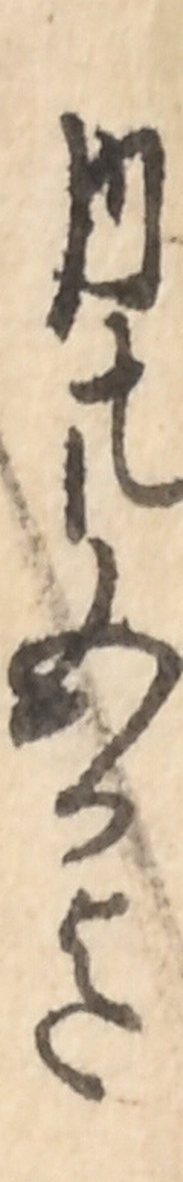同廿九日迄
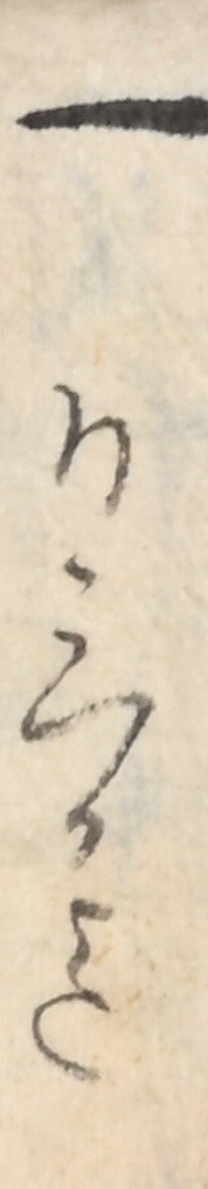同十三日迄
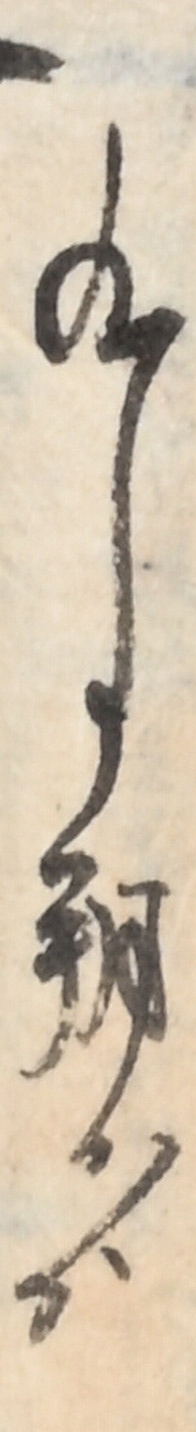九月五日ゟ
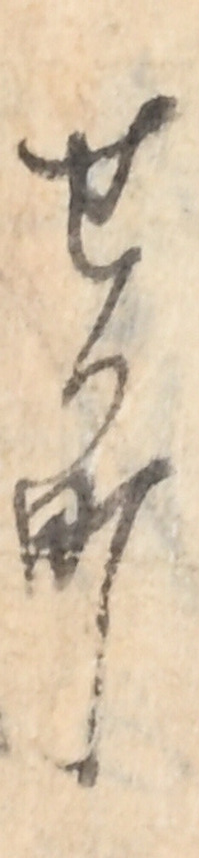せり町
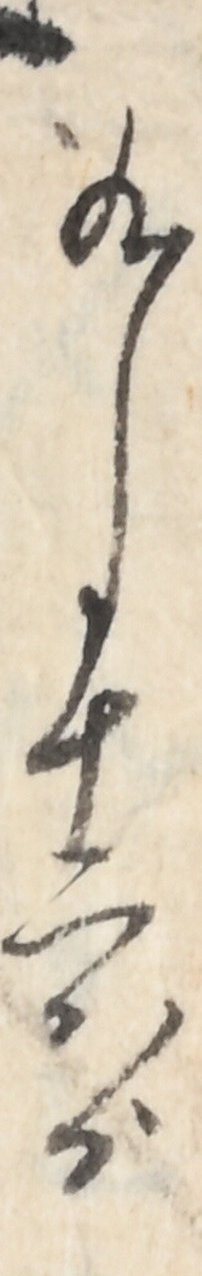九月十八日ゟ
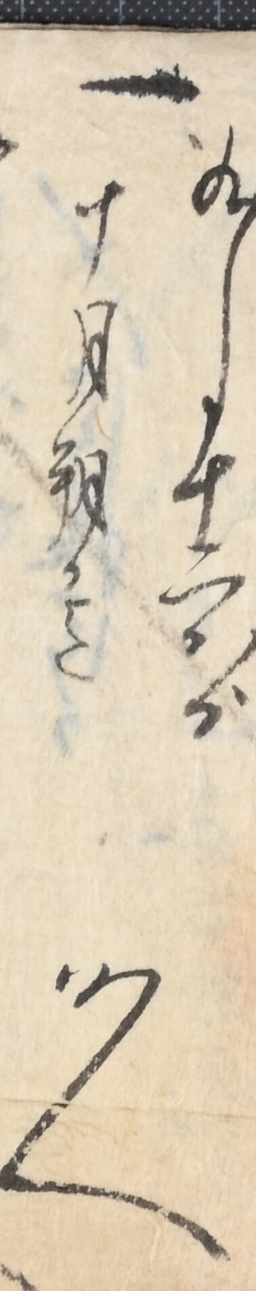一十月八日迄同人

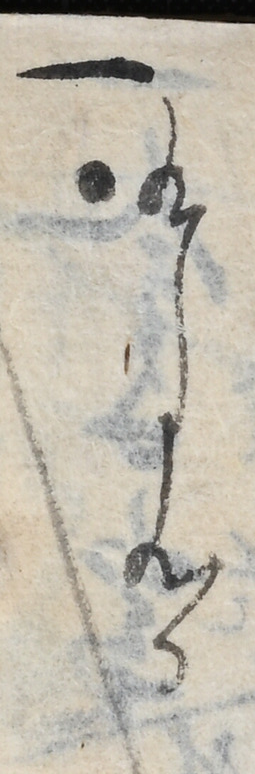九月九日ゟ
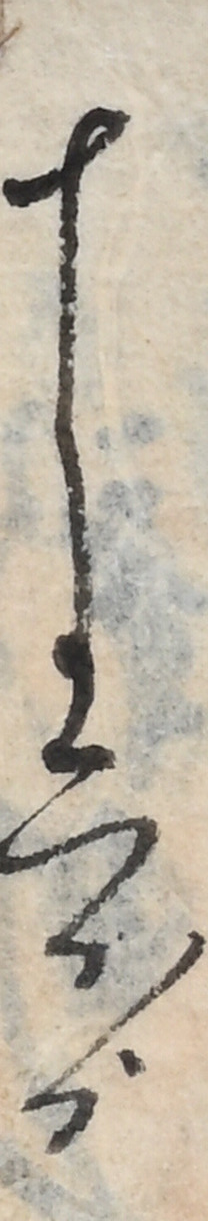十月二日ゟ
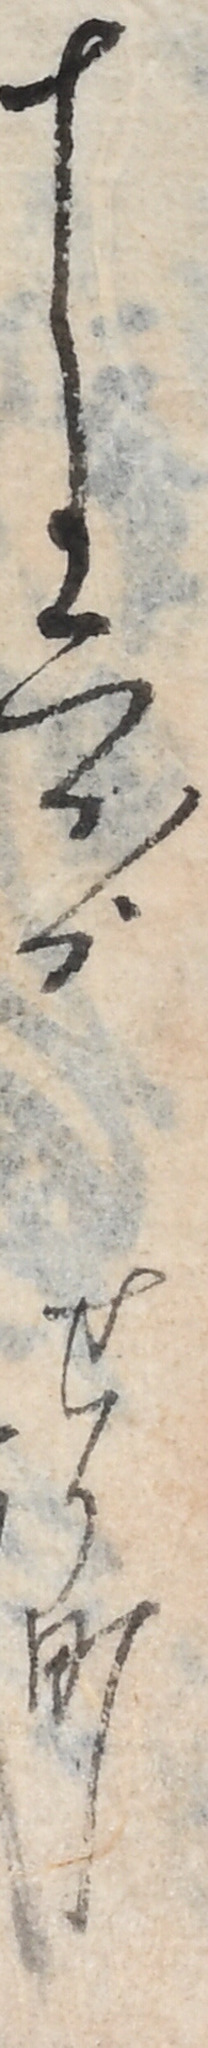九月十二日ゟ
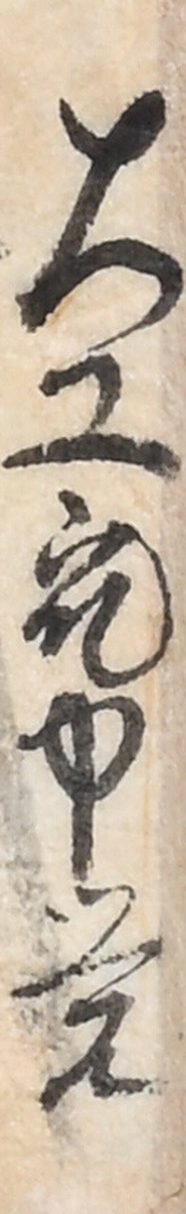大工衆中覚
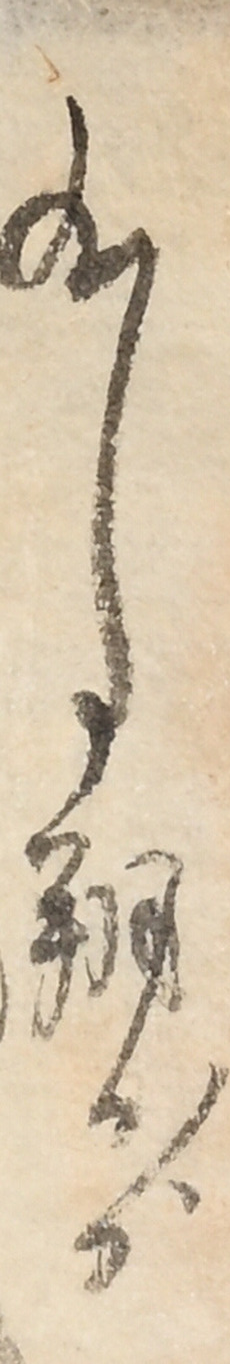九月朔日ゟ
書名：合力覚帳
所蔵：伊那市立高遠町図書館・合同会社AMANE
